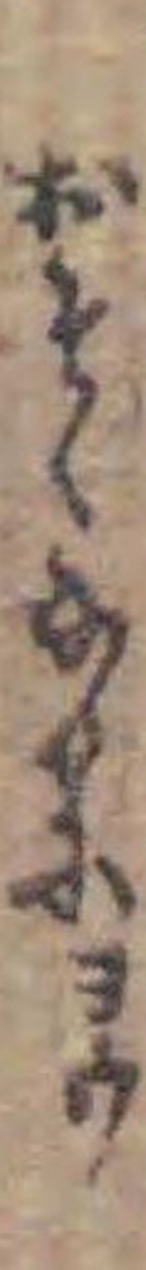おそくなるにヨウ
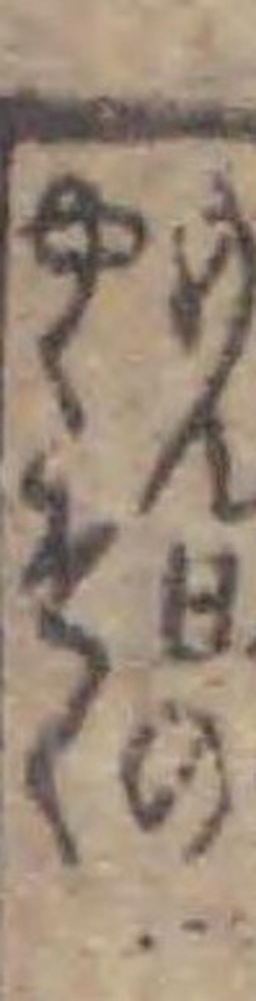やくそく
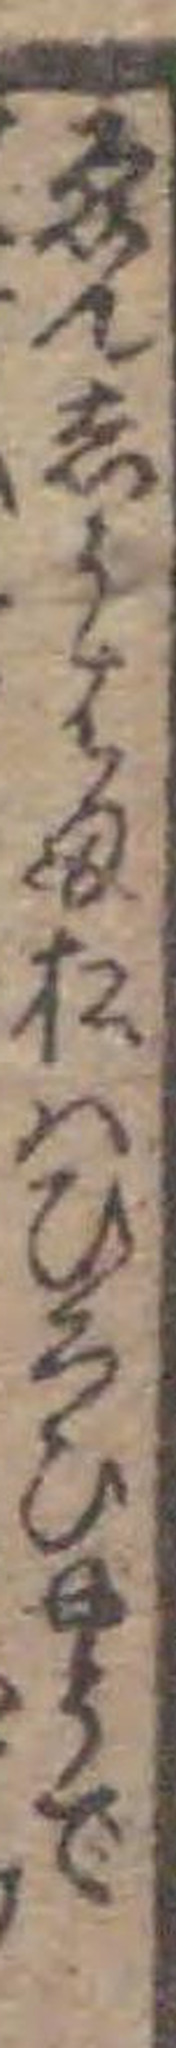ゑんしうはま松はひろひやうで
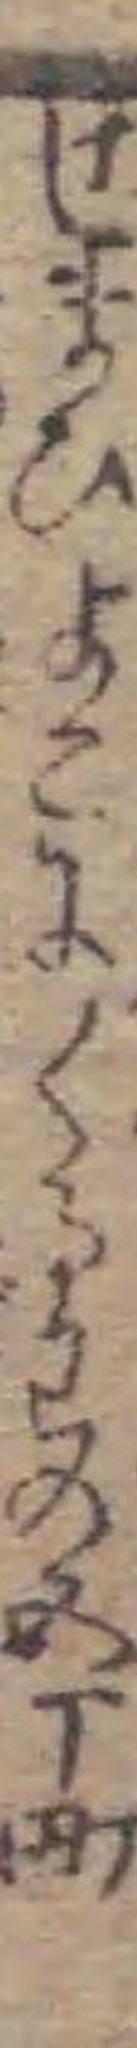せまひよこにくるわの五十町
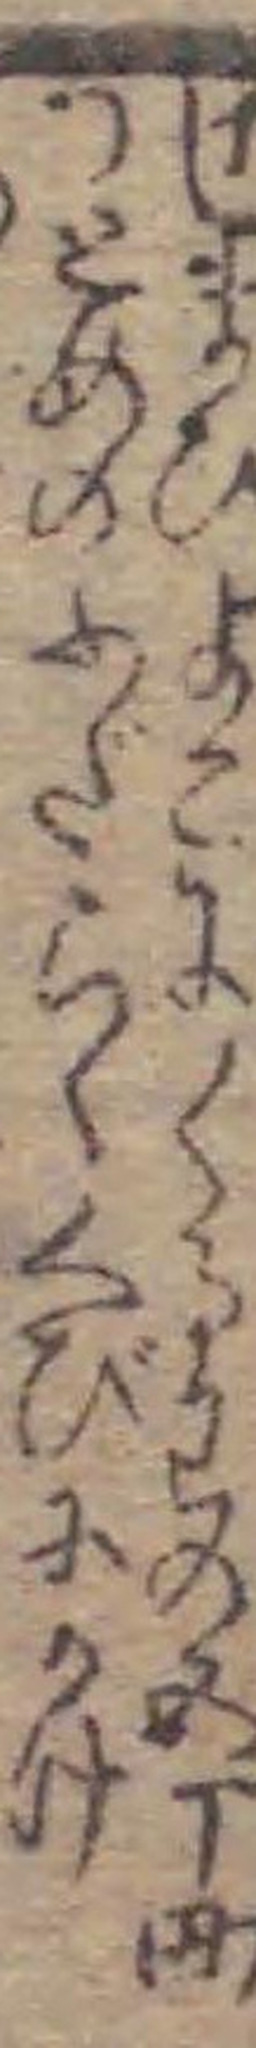つとめのふだらくくびにかけ
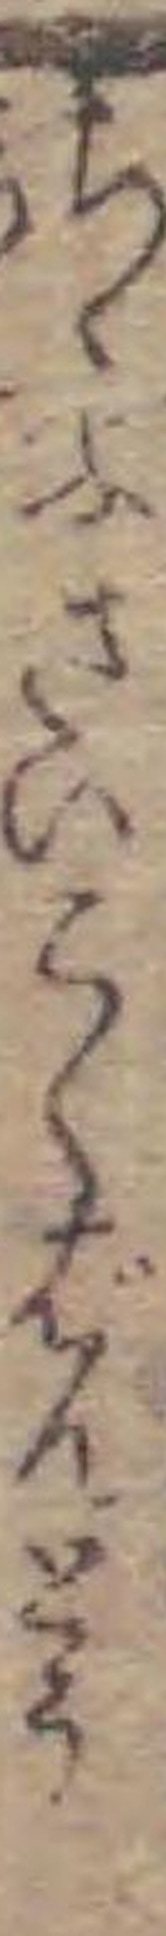ちゝぶさいこくばんどう
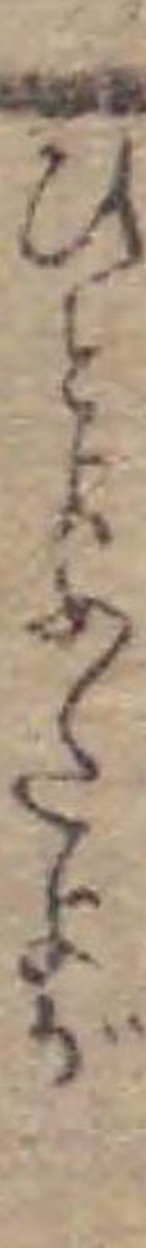ひとよふたよが
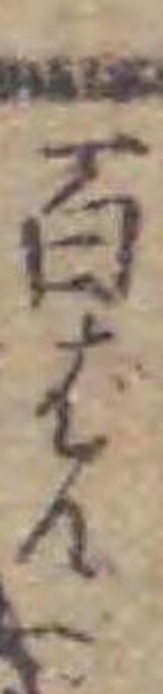百ばん
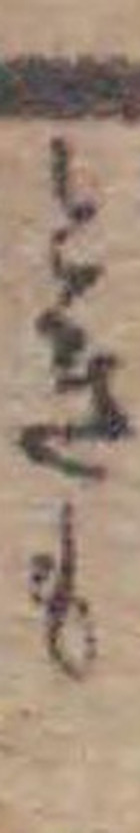ときも
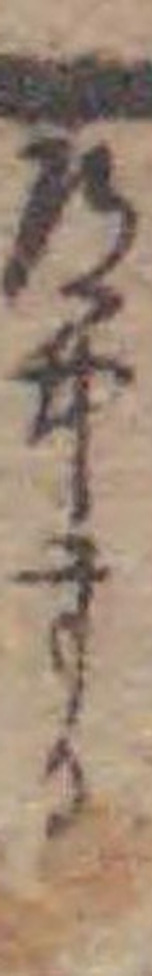道中する

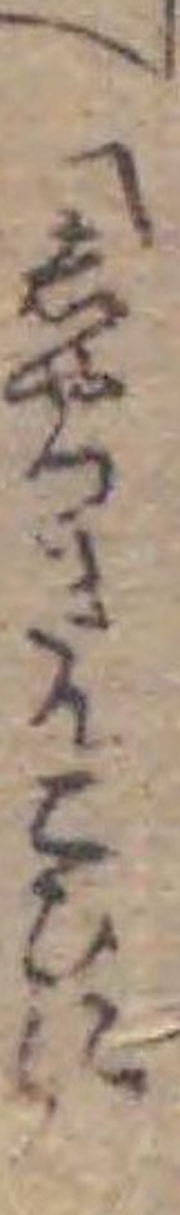〽しやつきんこひに
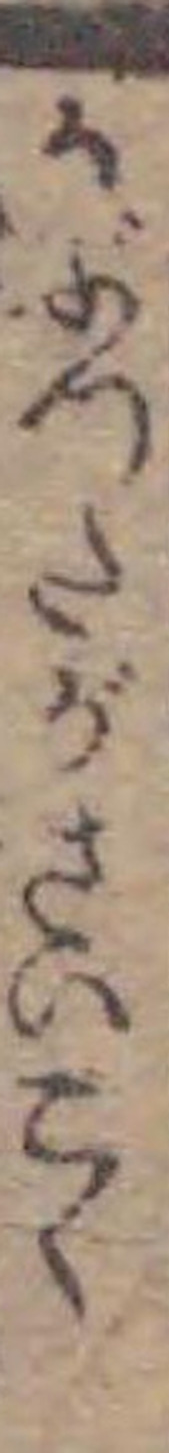かぶつたがさいこく
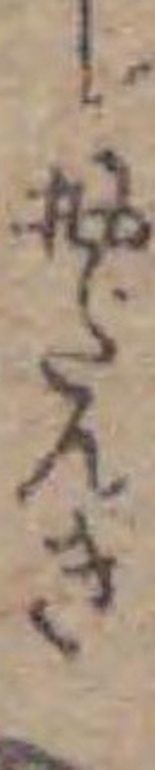おたんき
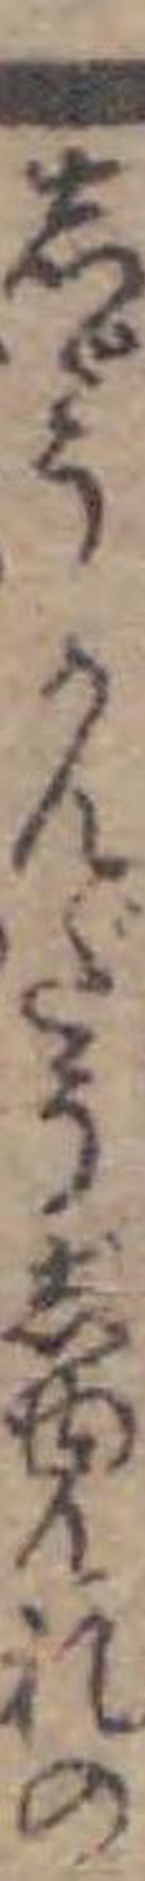しゞうかんだうしゆん礼の
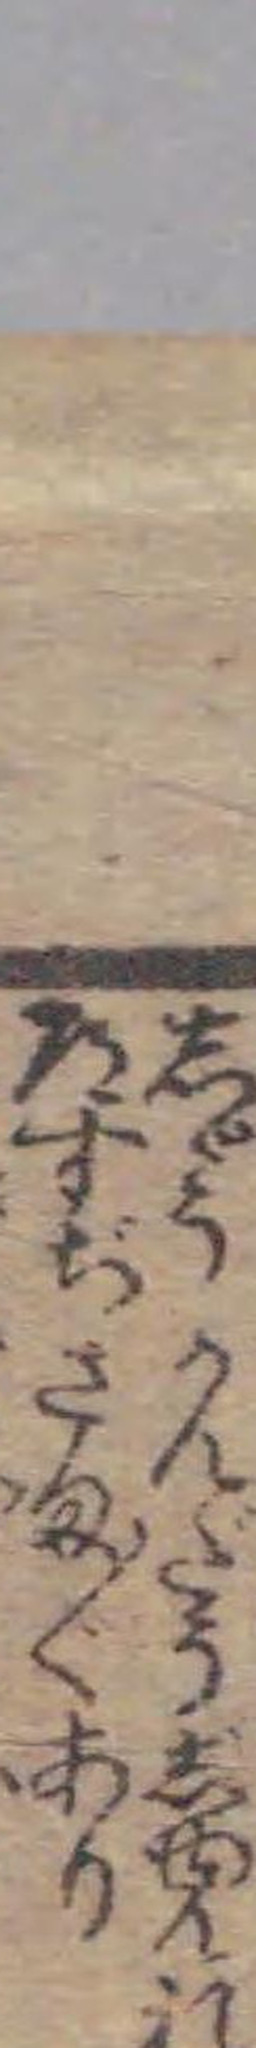道すぢさま〴〵あり
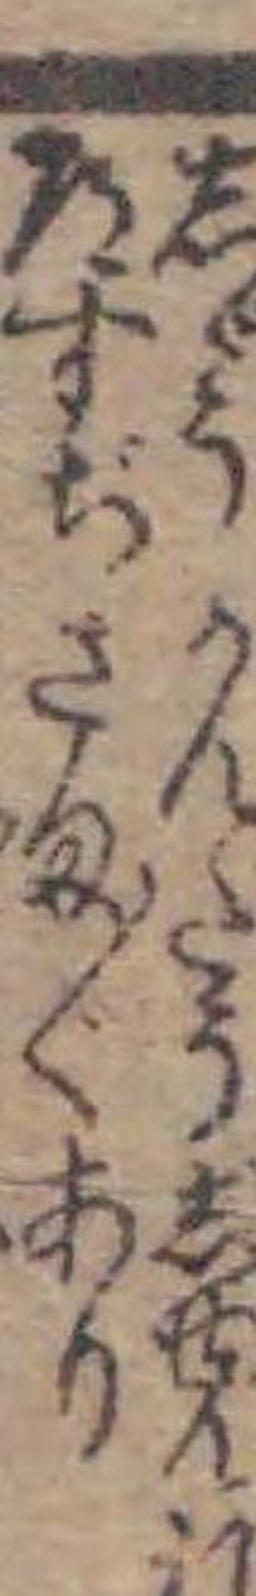道すぢさま〴〵あり
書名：北国順礼唄方便 : 3巻
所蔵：国立国会図書館 National Diet Library, JAPAN
